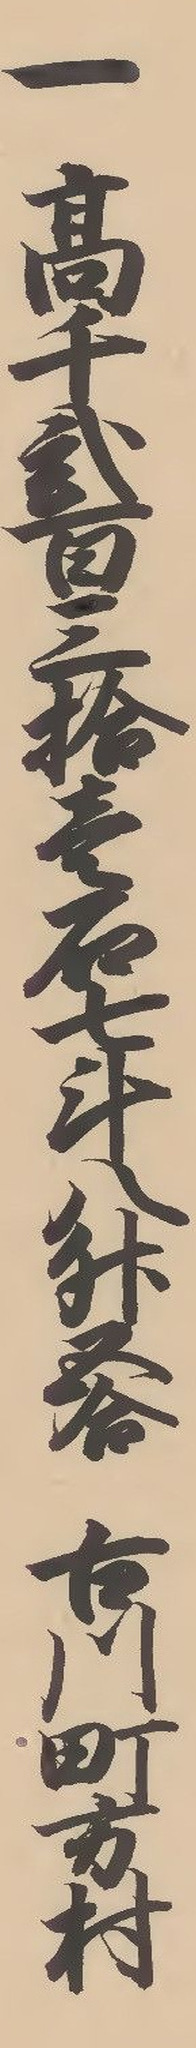一高千弐百三拾壱石七斗八升五合古川町方村

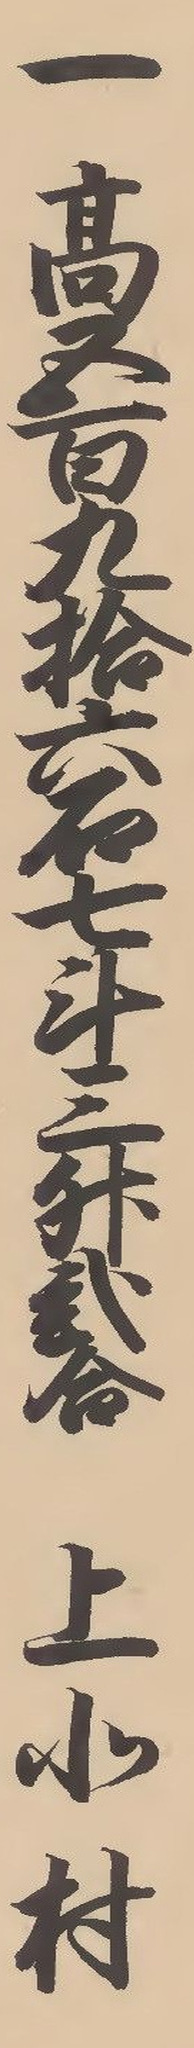一高五百九拾六石七斗三升弐合上北村
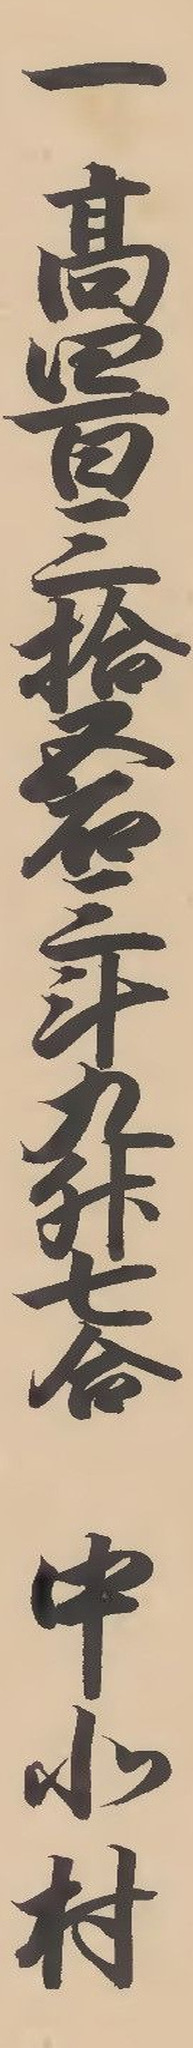一高四百三拾五石三斗九升七合中北村
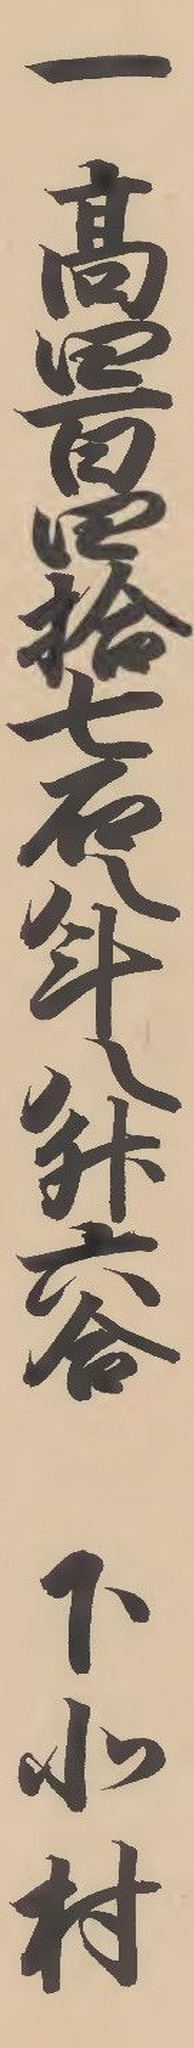一高四百四拾七石八斗八升六合下北村
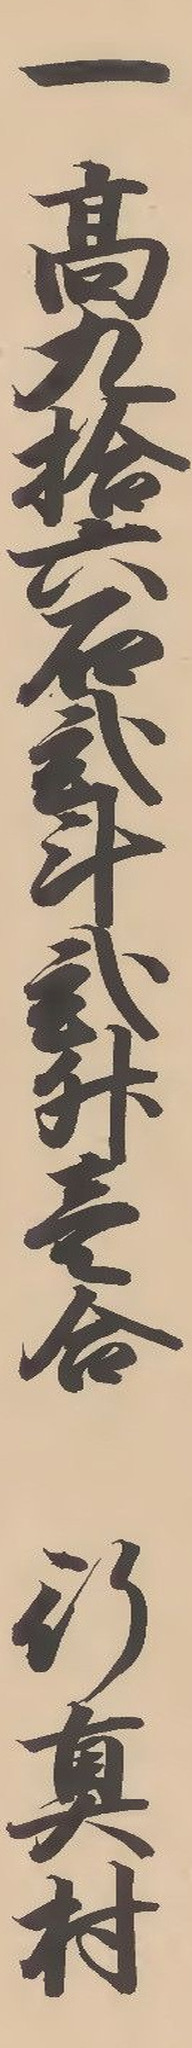一高九拾六石弐斗弐升壱合行真村
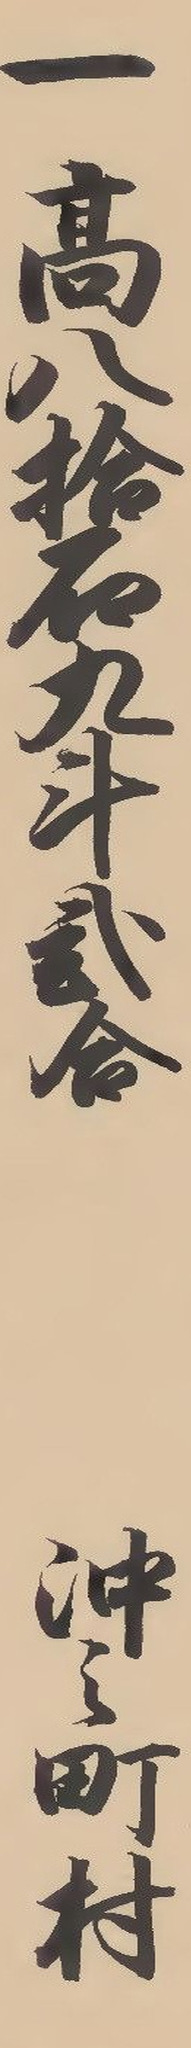一高八拾石九斗弐合沖之町村
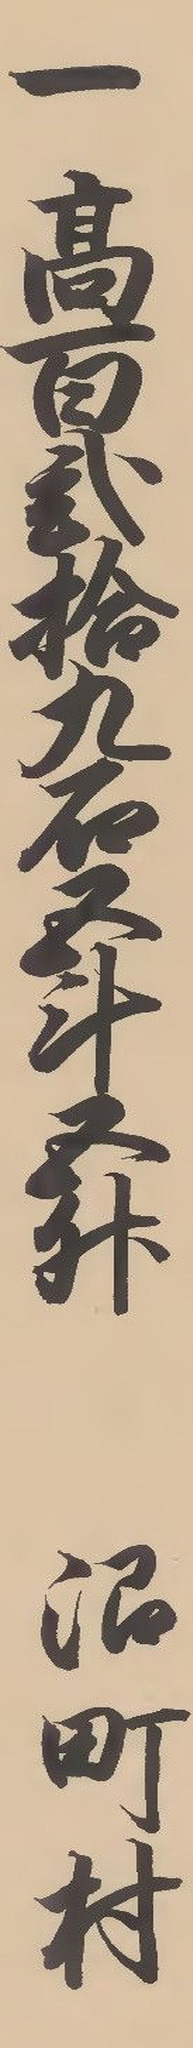一高百弐拾九石五斗五升沼町村
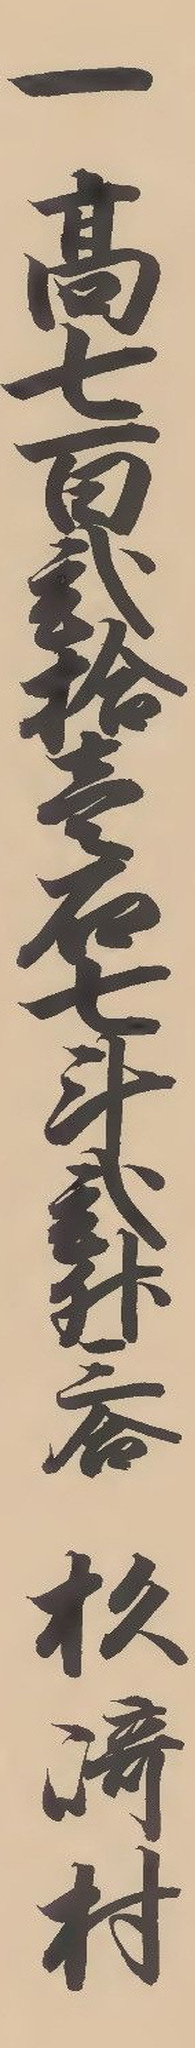一高七百弐拾壱石七斗弐升三合杉崎村
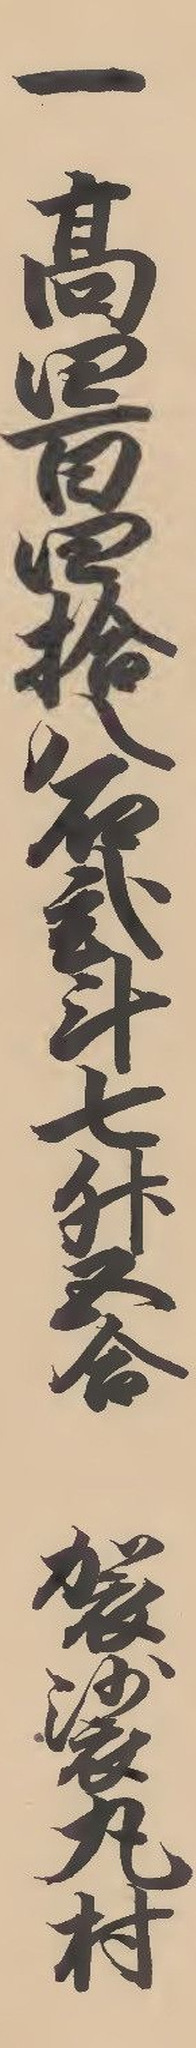一高四百四拾八石弐斗七升五合袈裟丸村

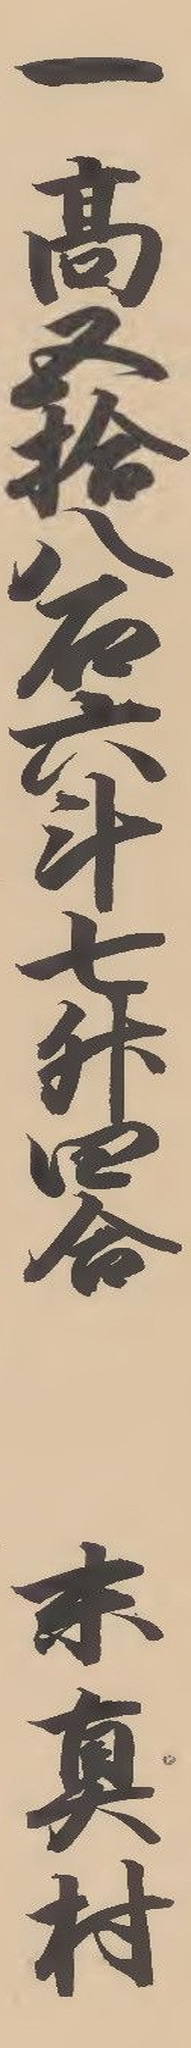一高五拾八石六斗七升四合末真村
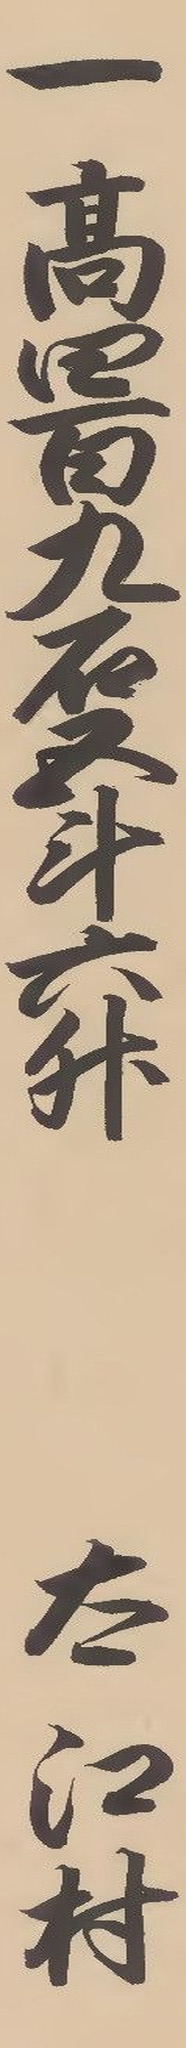一高四百九石五斗六升太江村
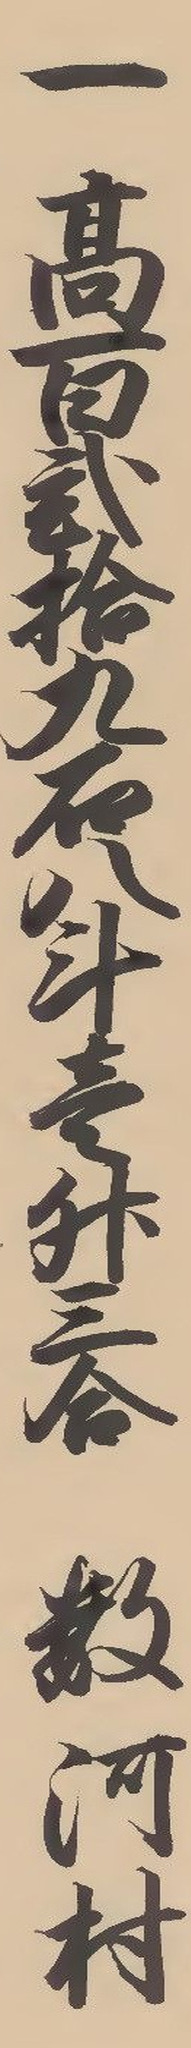一高百弐拾九石八斗壱升三合数河村
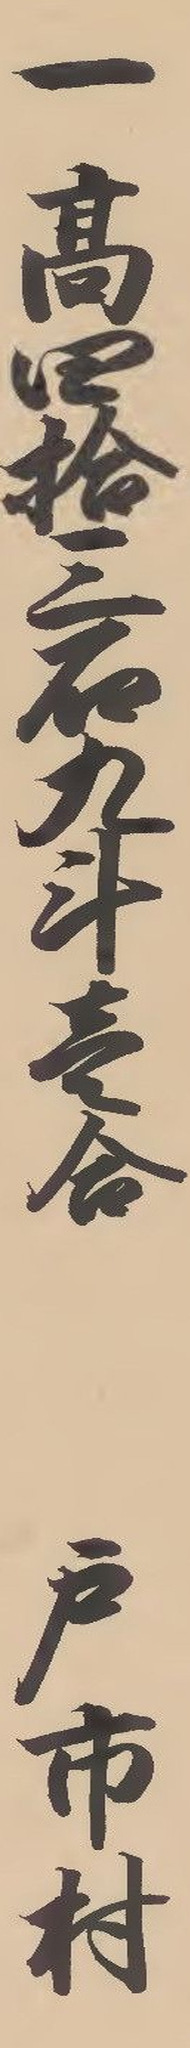一高四拾三石九斗壱合戸市村
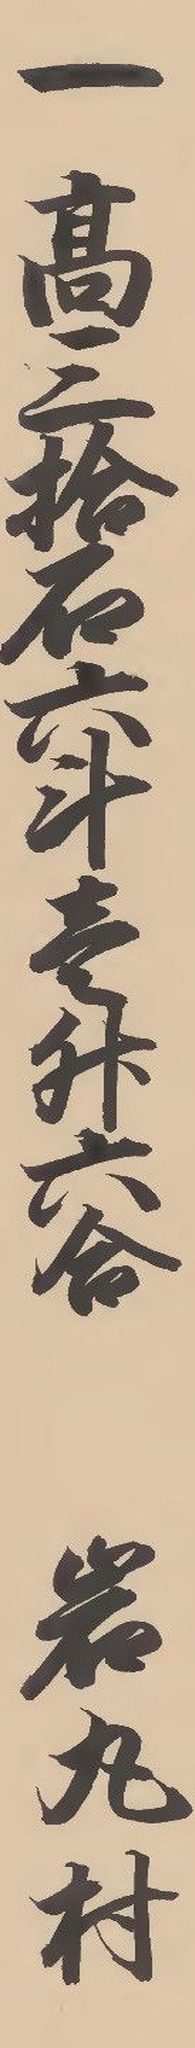一高三拾石六斗壱升六合岩丸村
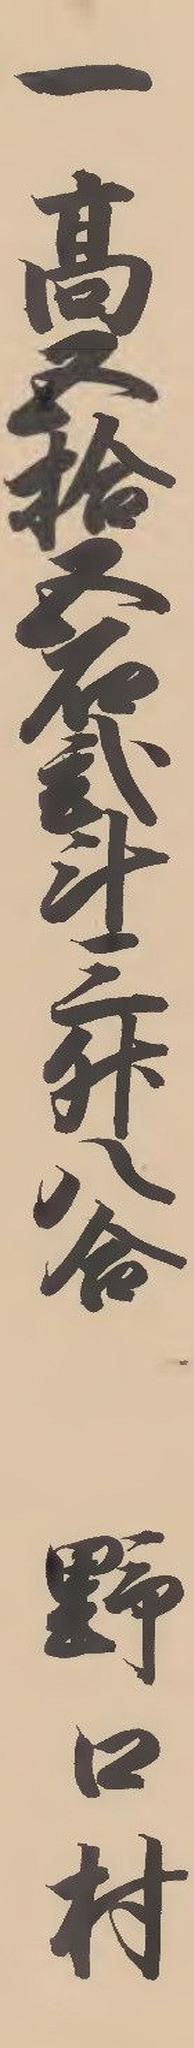一高五拾五石弐斗三升八合野口村
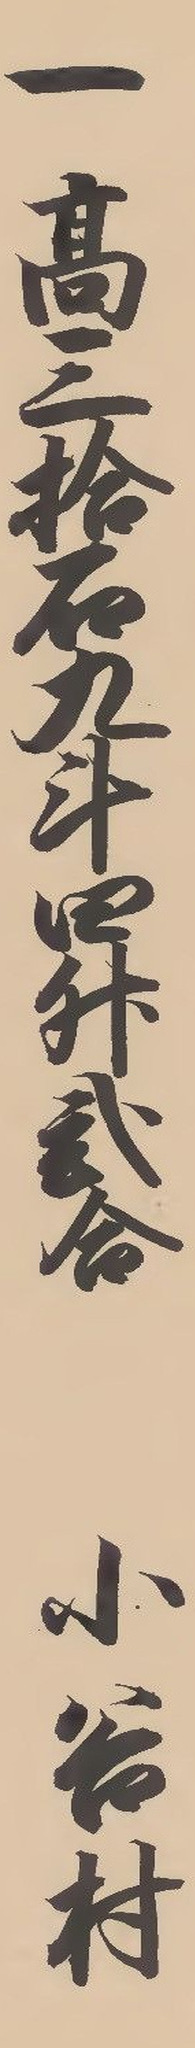一高三拾石九斗四升弐合小谷村
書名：飛騨国郷帳
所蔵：国立公文書館 National Archives of Japan
